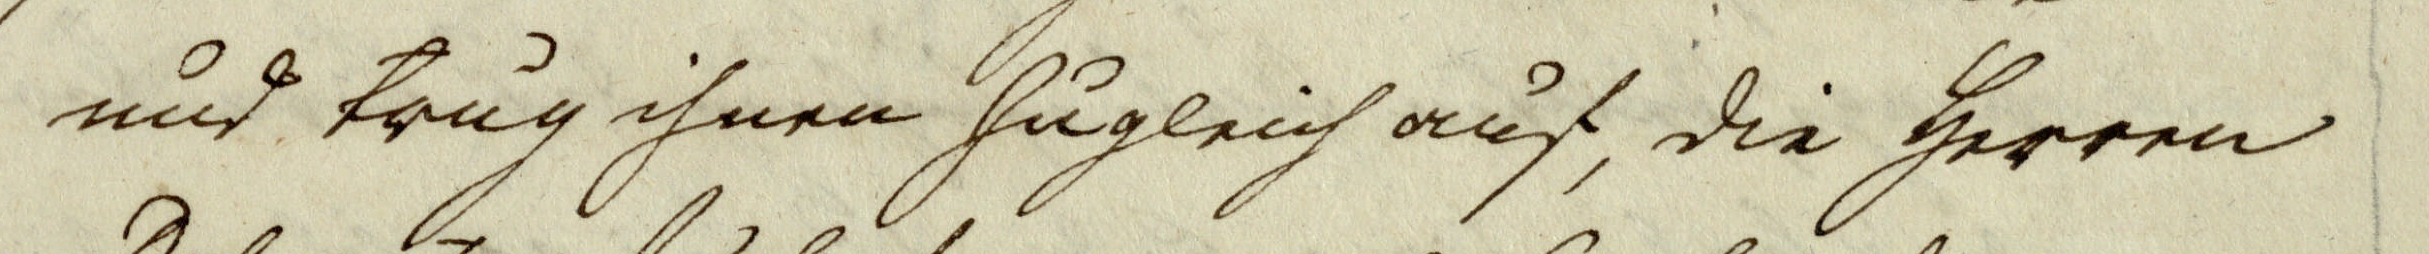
und trug ihnen zugleich auf, die Herren
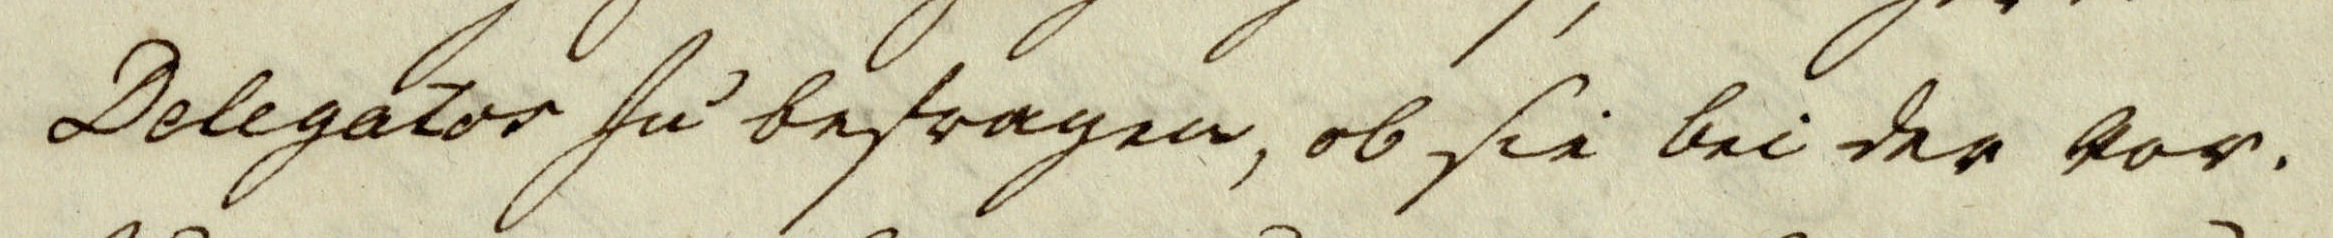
Delegatos zu befragen, ob sie bei der vor¬
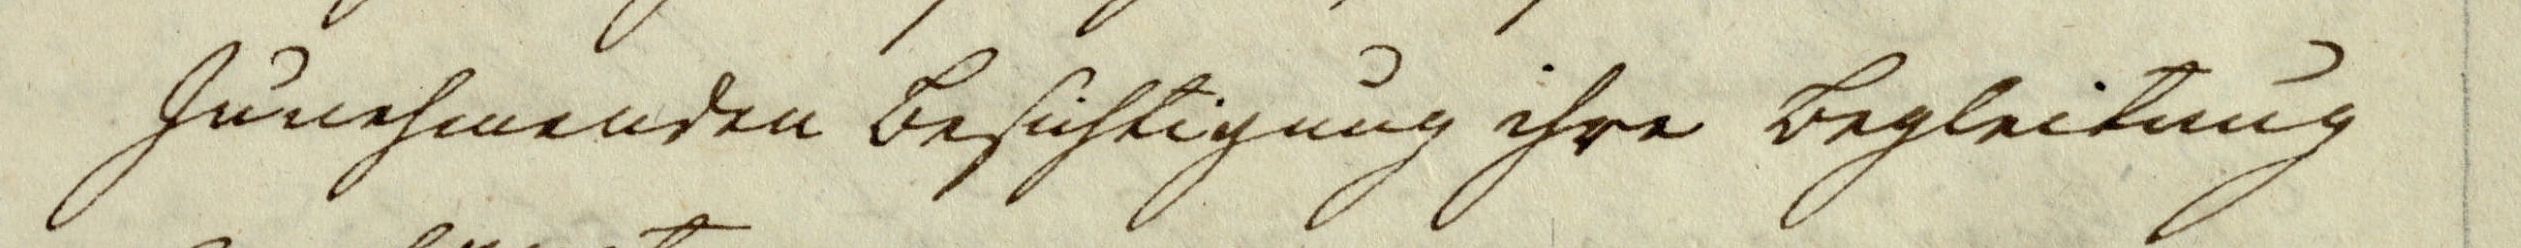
zunehmenden Besichtigung ihre Begleitung
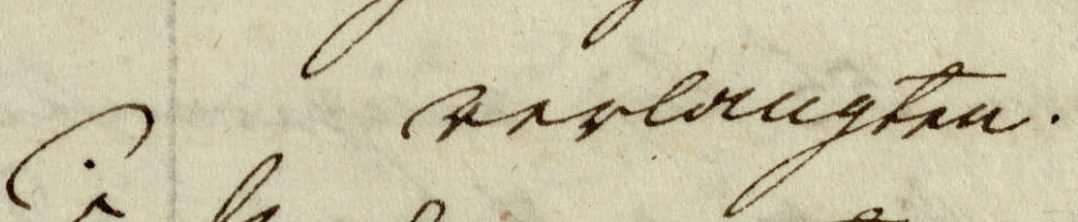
verlangten.
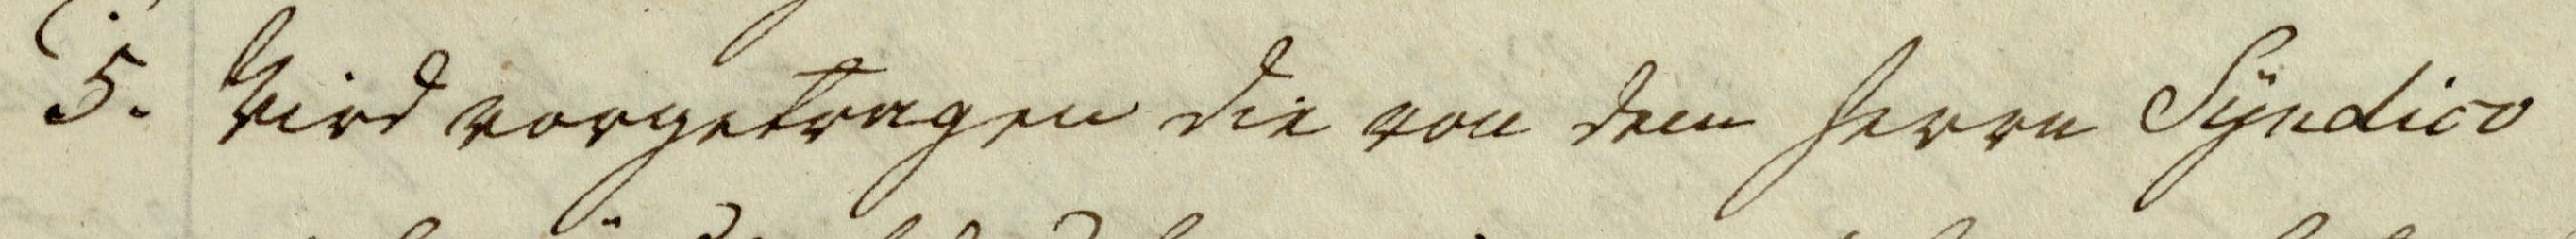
5. Wird vorgetragen die von dem Herrn Sÿndico
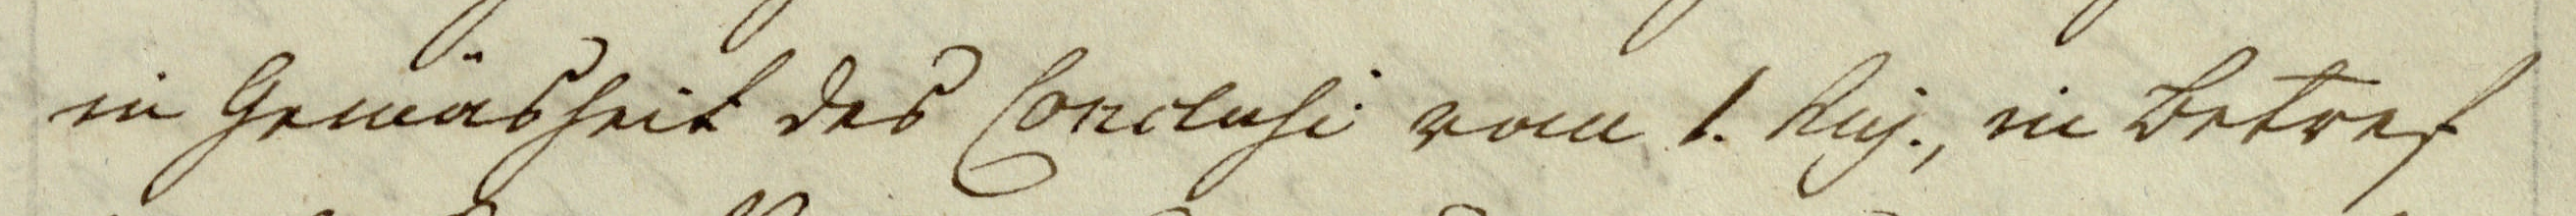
in Gemäsheit des Conclusi vom 1. huj., in Betref
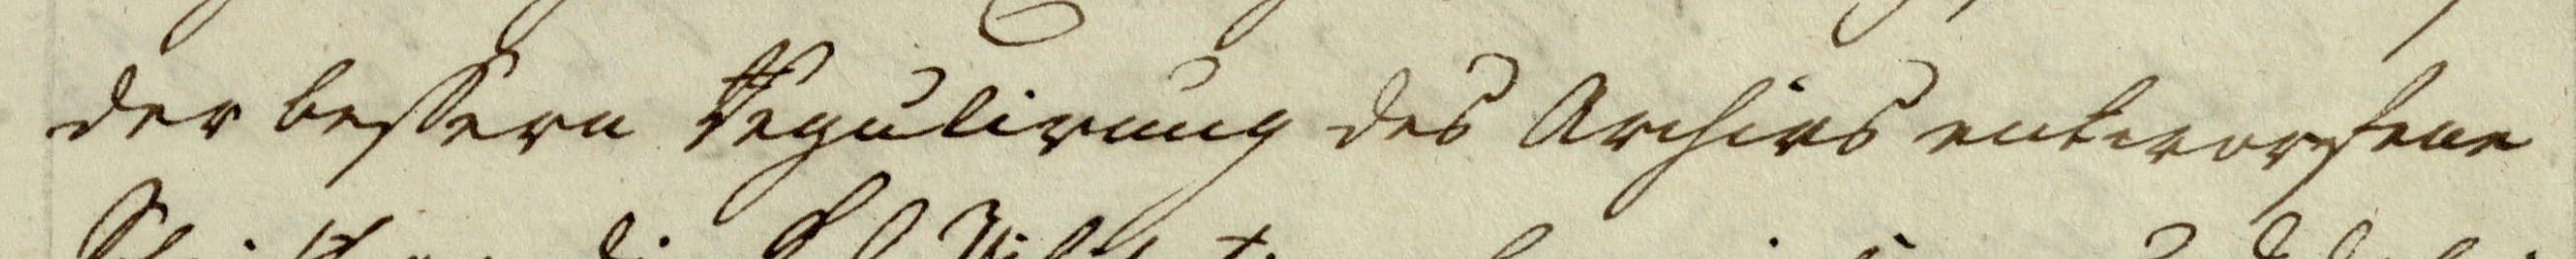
der bessern Regulirung des Archivs entworfene
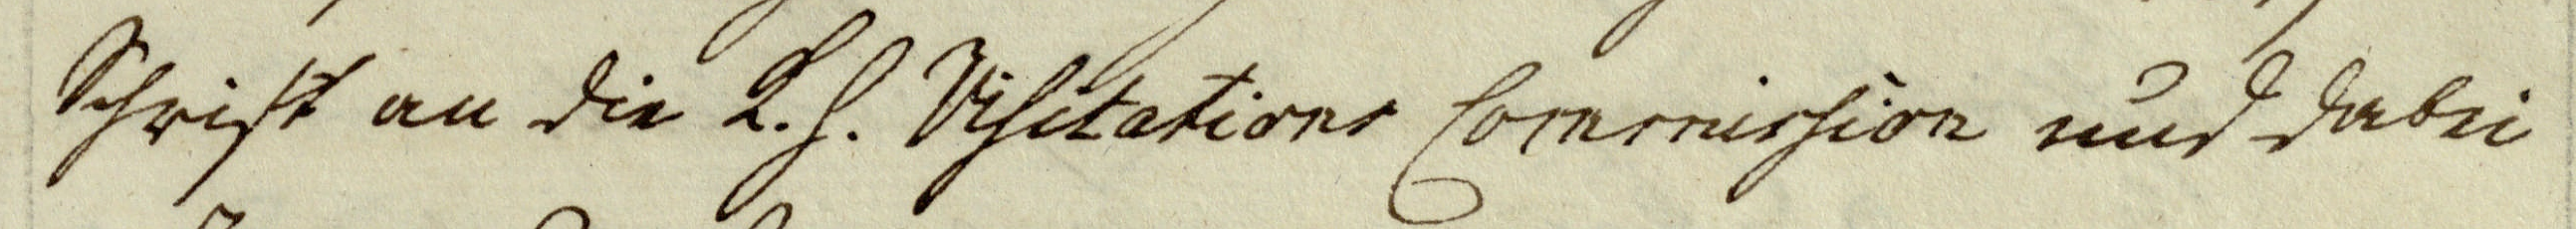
Schrift an die K. H. Visitations Commission und dabei
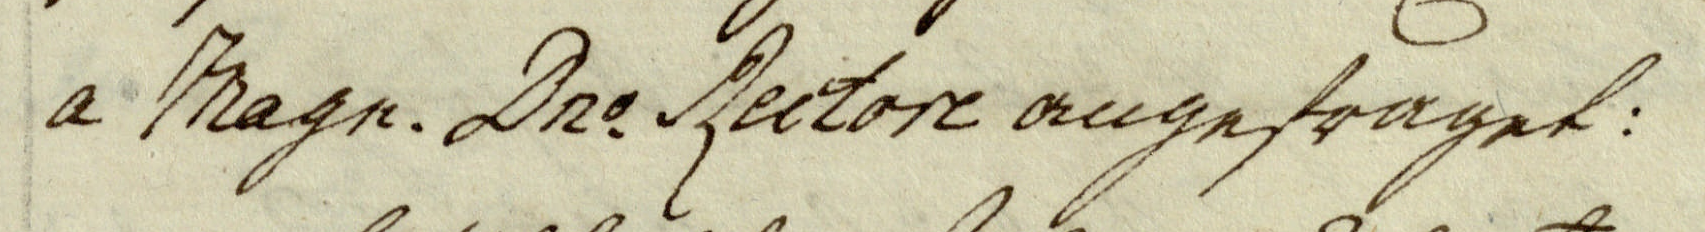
a Magn. Dno Rectore angefraget:
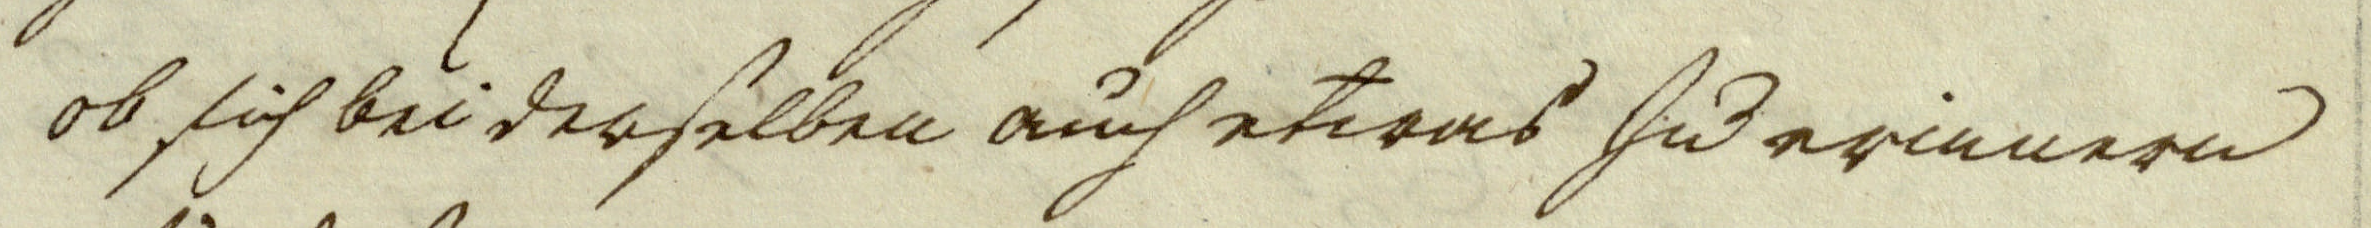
ob sich bei derselben auch etwas zu erinnern
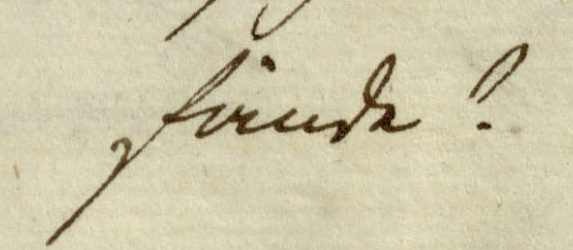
finde?
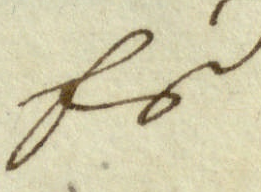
Es
